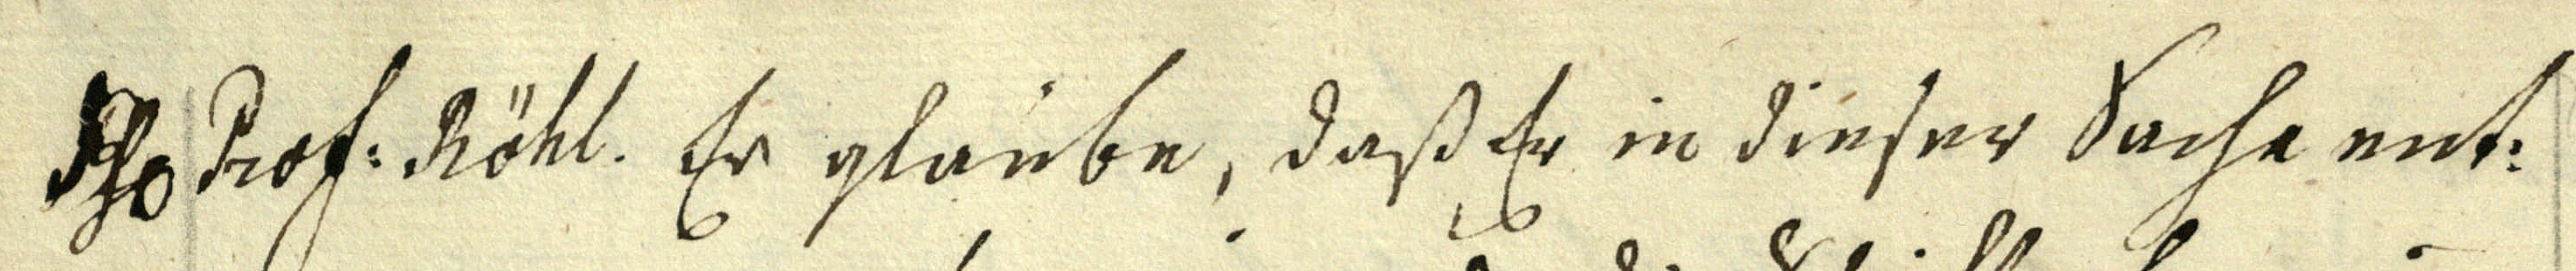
dh Prof. Röhl. Er glaube, daß Er in dieser Sache ent¬
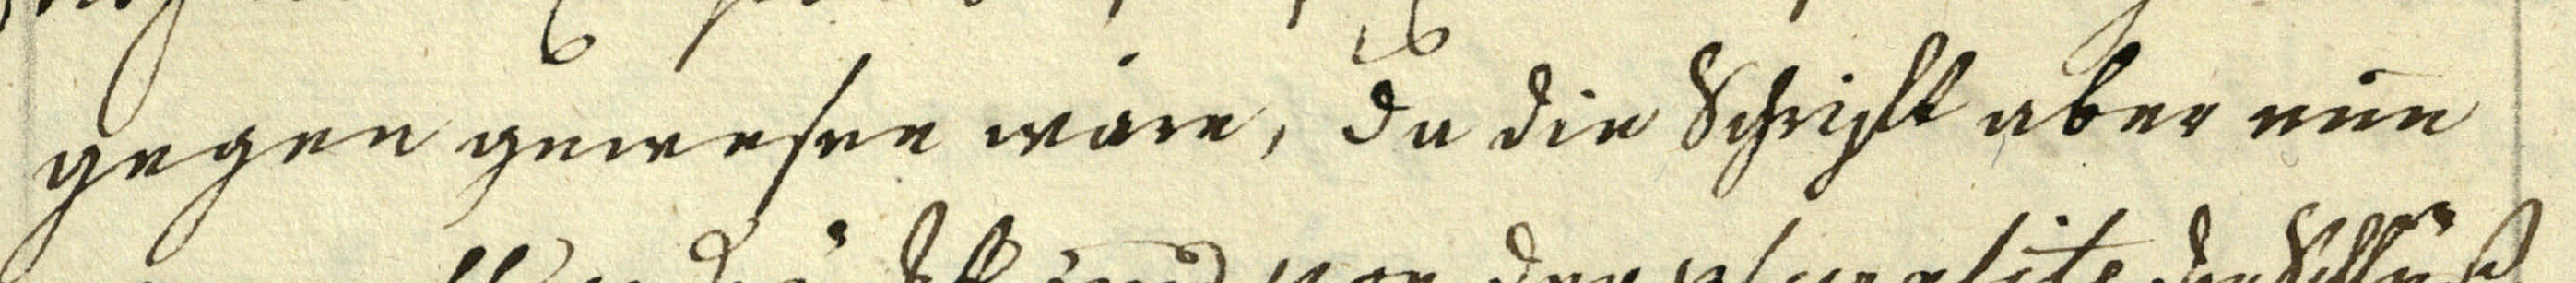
gegen gewesen wäre, da die Schrift aber nun
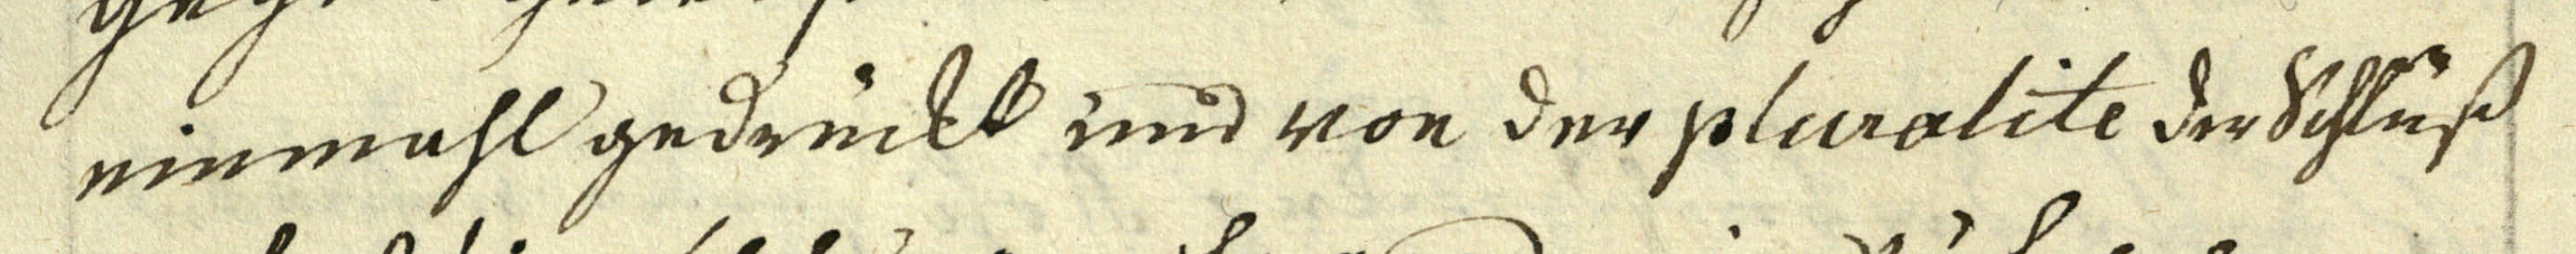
einmahl gedruckt und von der pluralite der Schluß
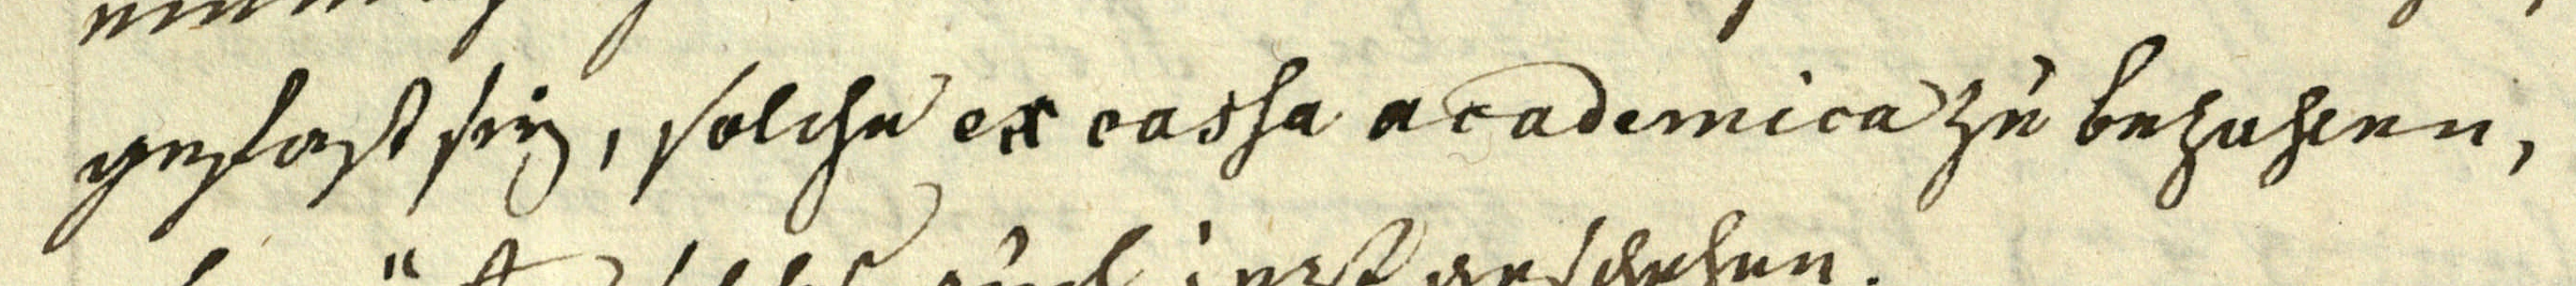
gefaßt seÿ, solche ex cassa academica zu bezahlen,
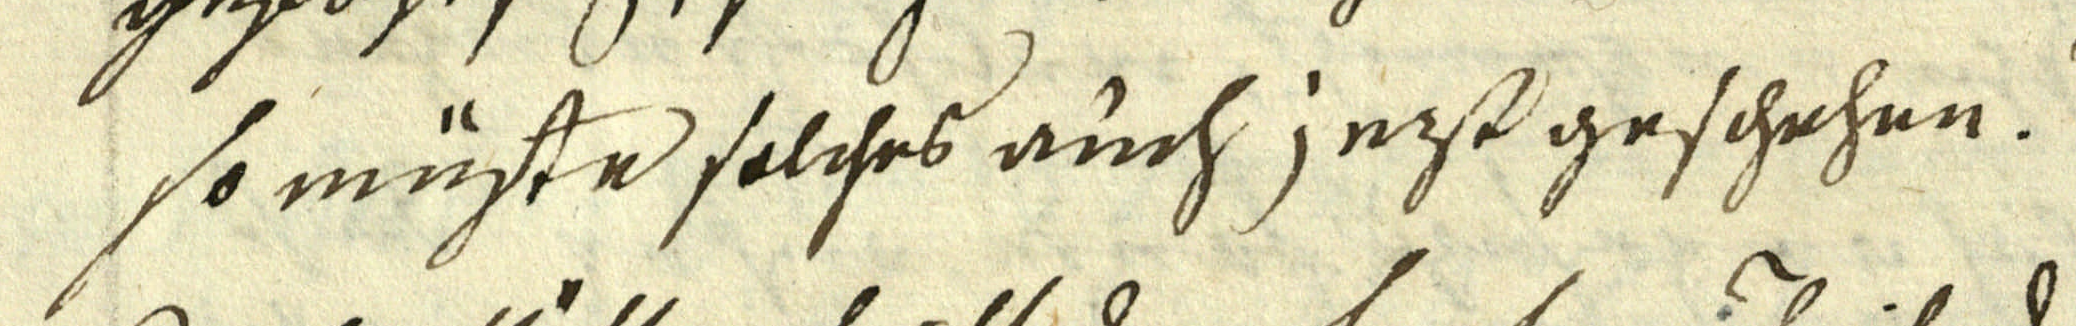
so müste solches auch jezt geschehen.
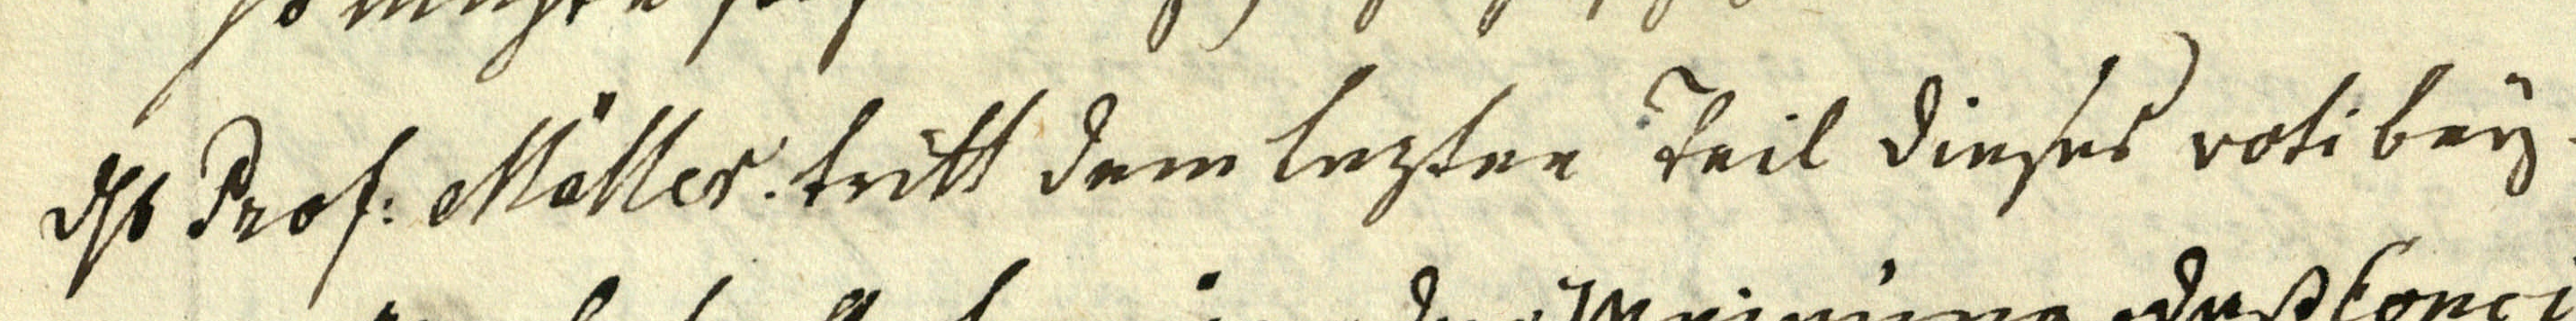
dh. Prof. Möller tritt dem lezten Teil dieses voti beÿ.
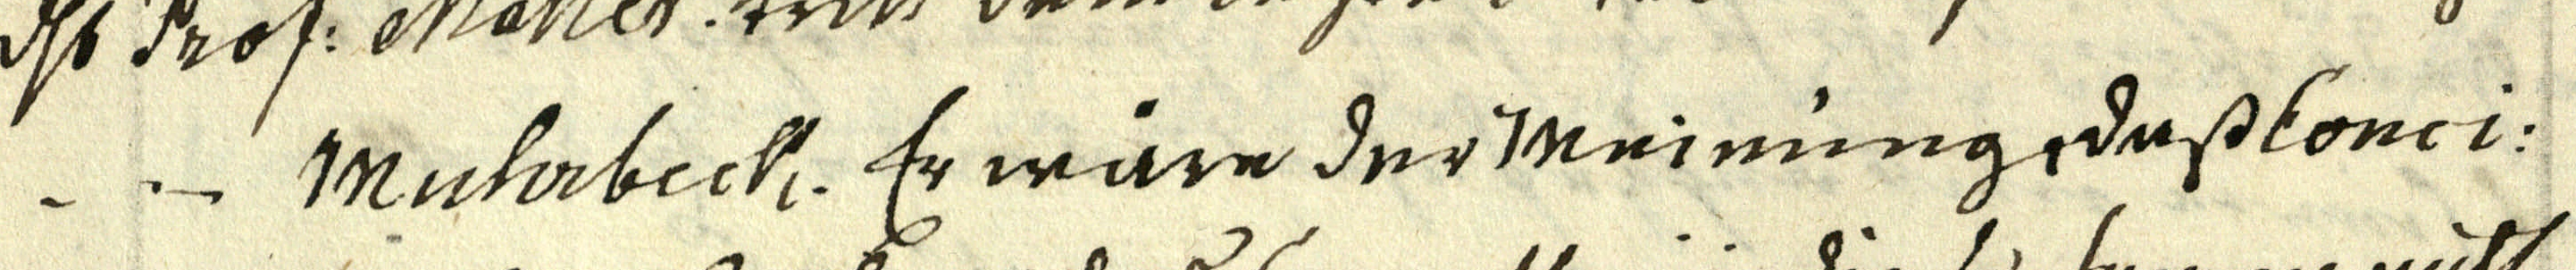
Muhrbeck. Er wäre der Meinung, daß Conci¬
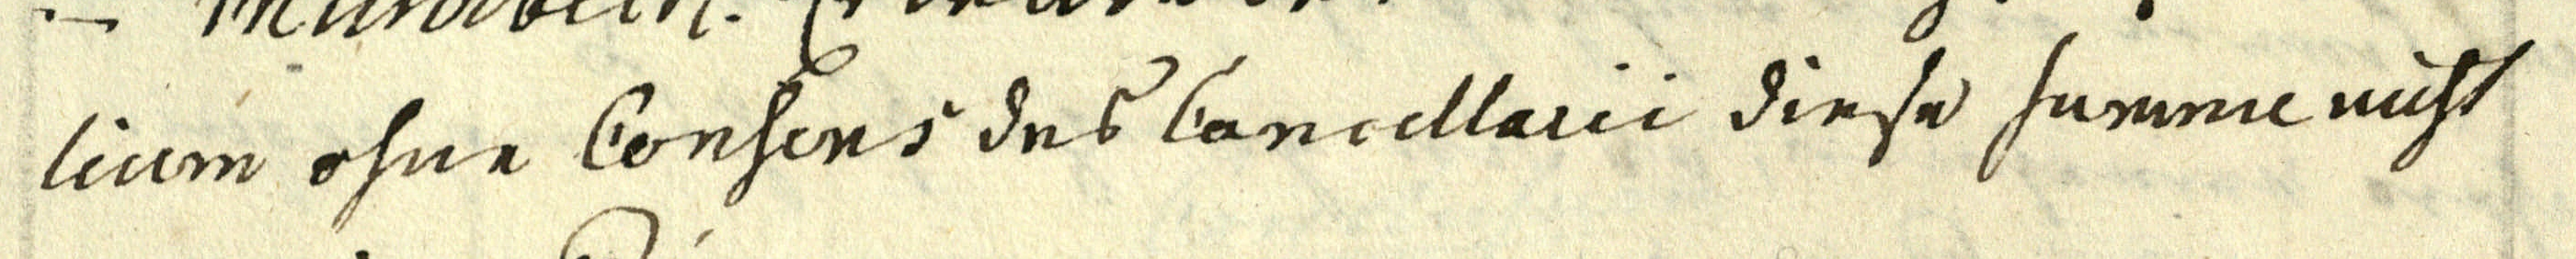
lium ohne Consens des Cancellarii diese Summe nicht
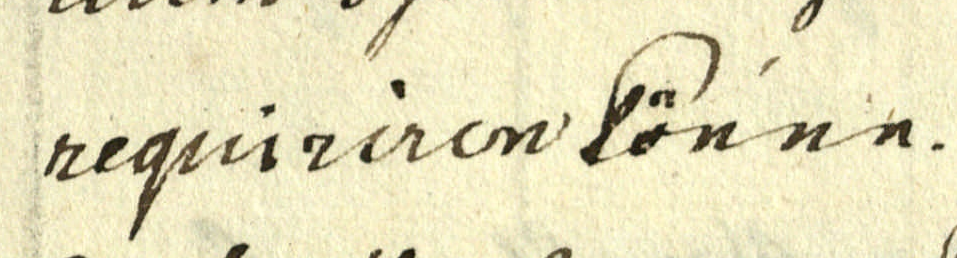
requiriren könne.
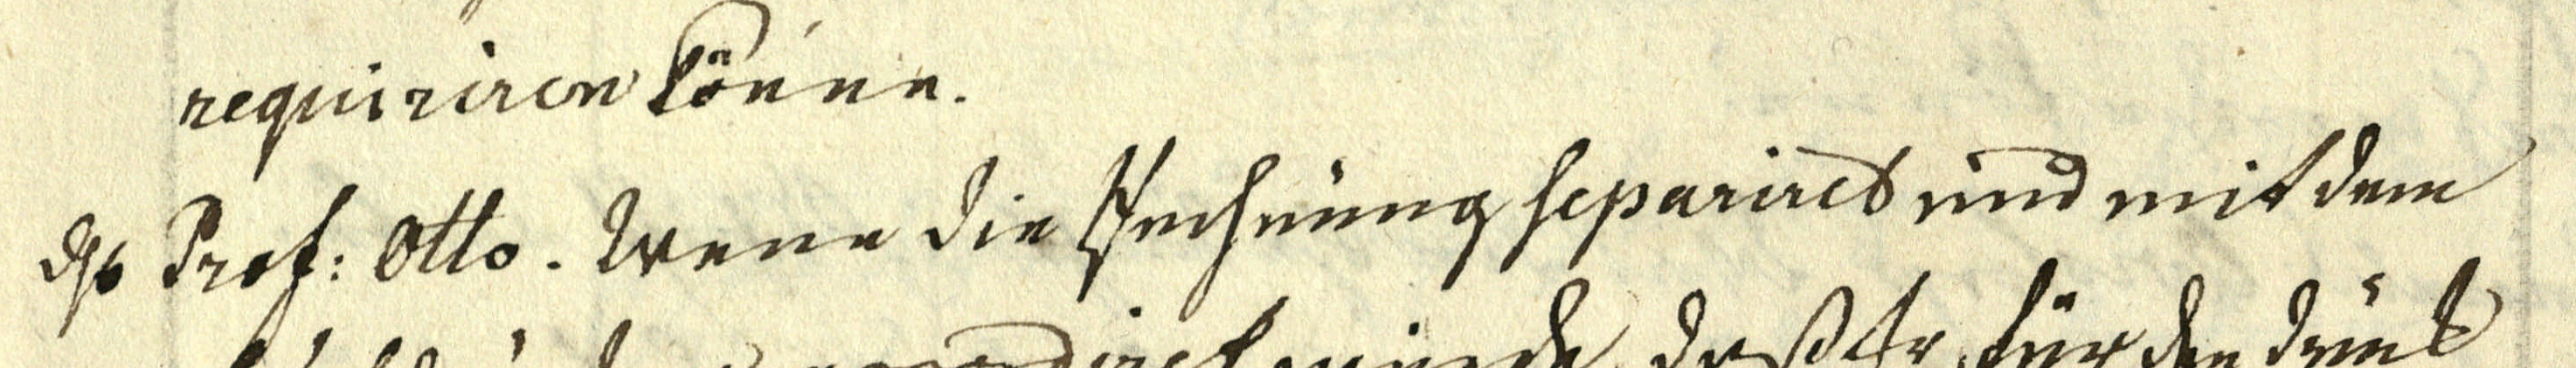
dh Prof. Otto. Wenn die Rechnung separiret und mit dem
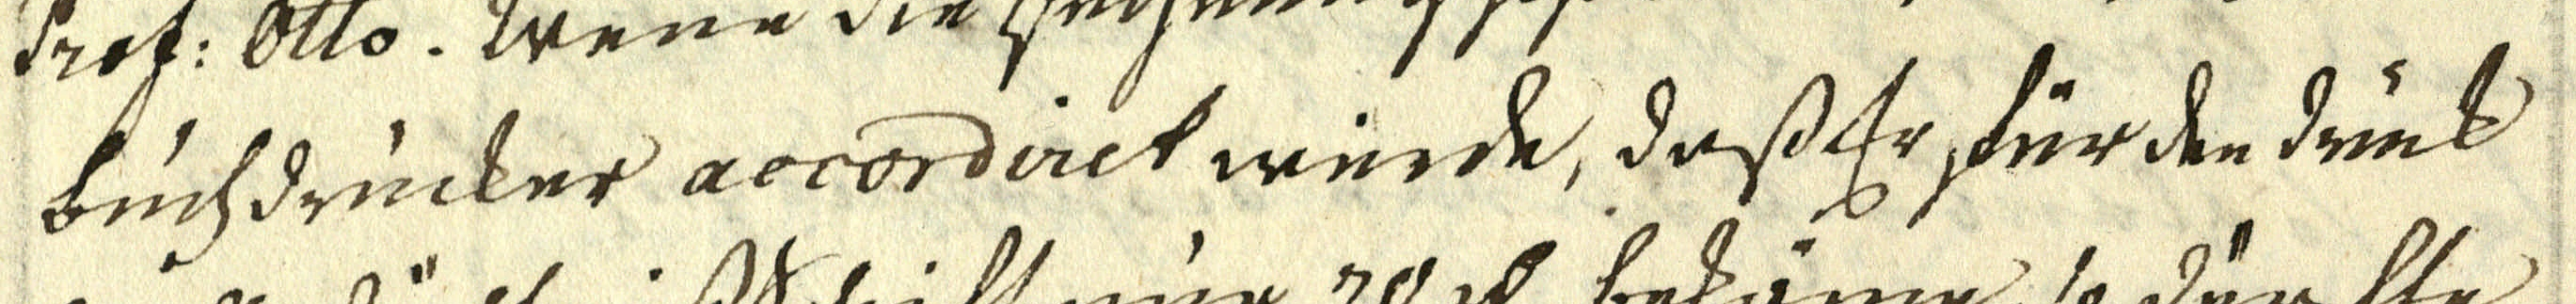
Buchdrucker accordirt würde, daß Er für den Druck
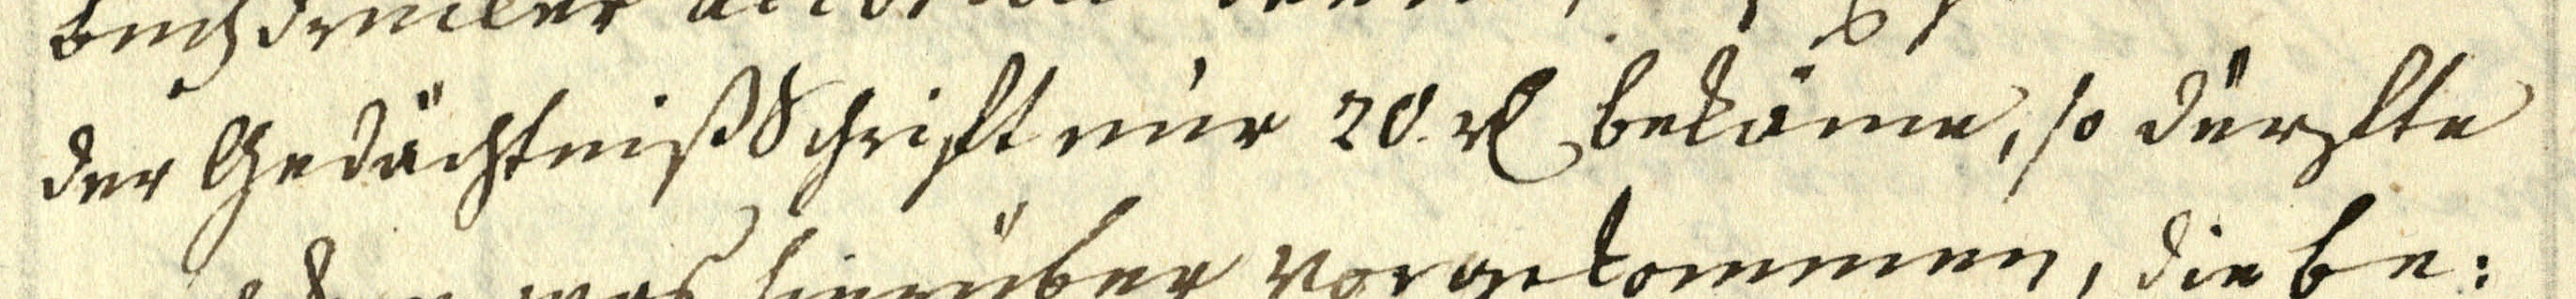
der Gedächtniß Schrift nur 20. rl. bekäme, so dürfte
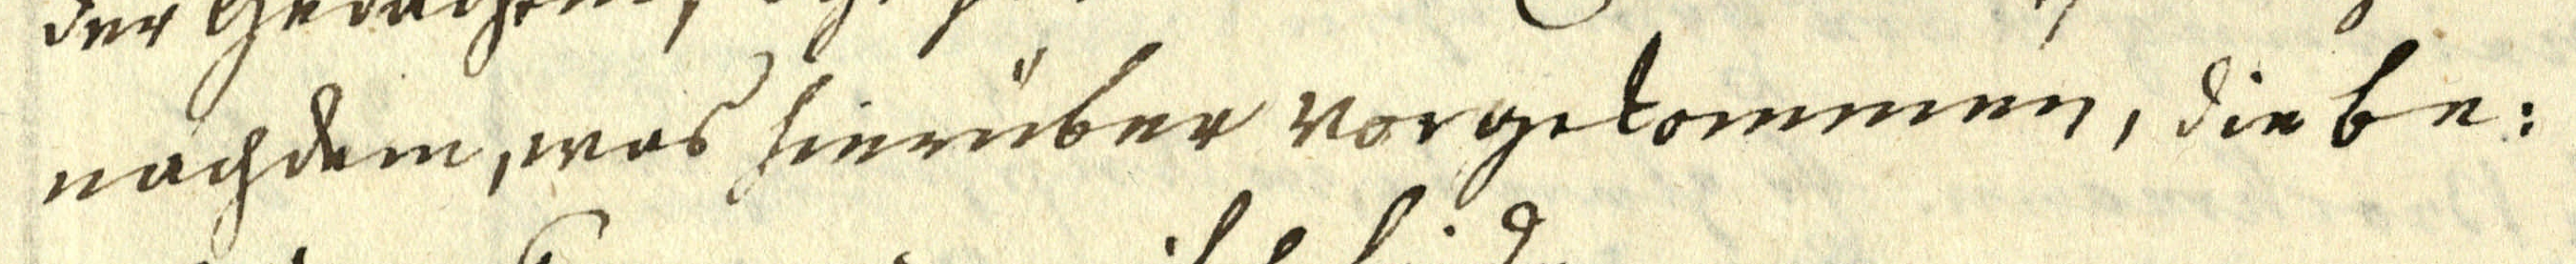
nachdem, was hierüber vorgekommen, die Be¬
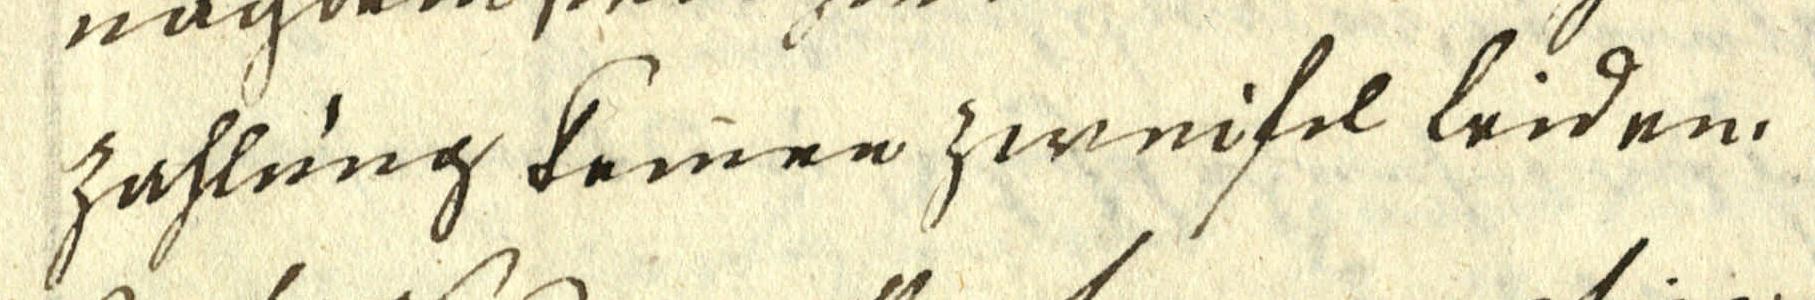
zahlung keinen Zweifel leiden.
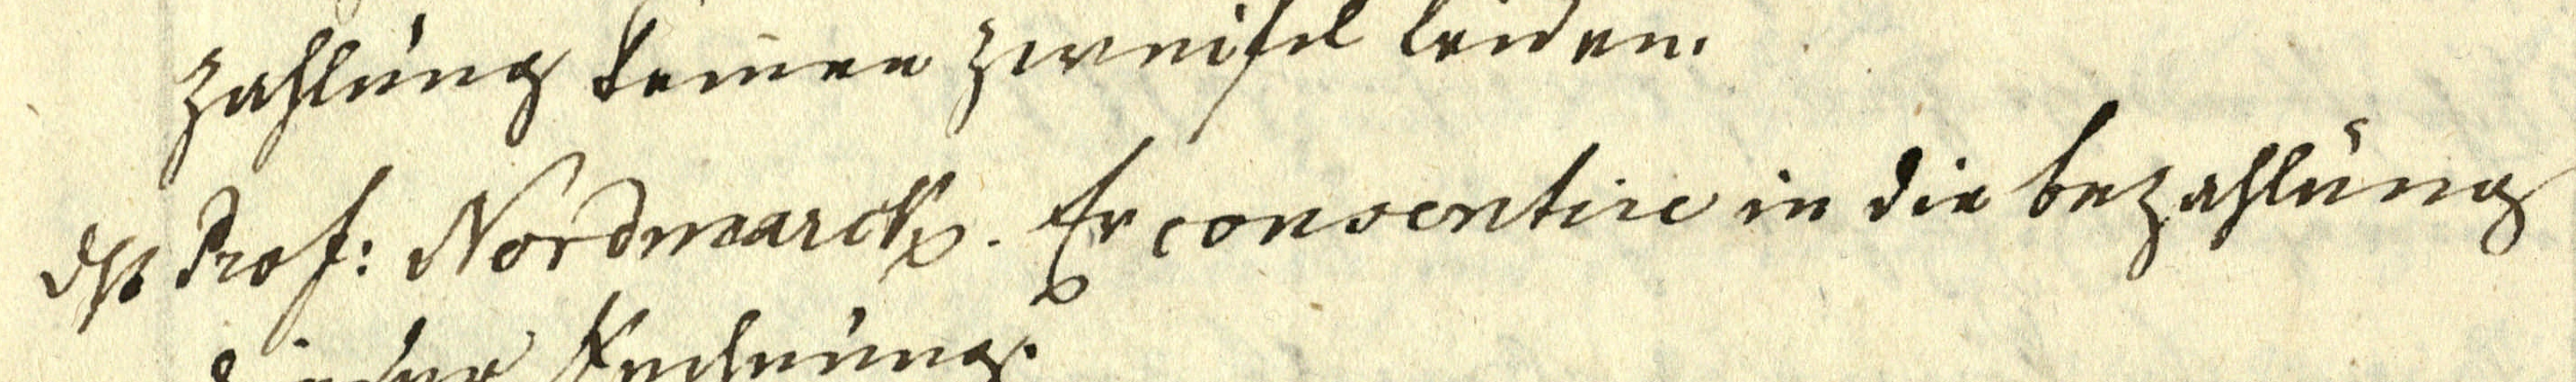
dh Prof. Nordmarck. Er consentire in die Bezahlung
